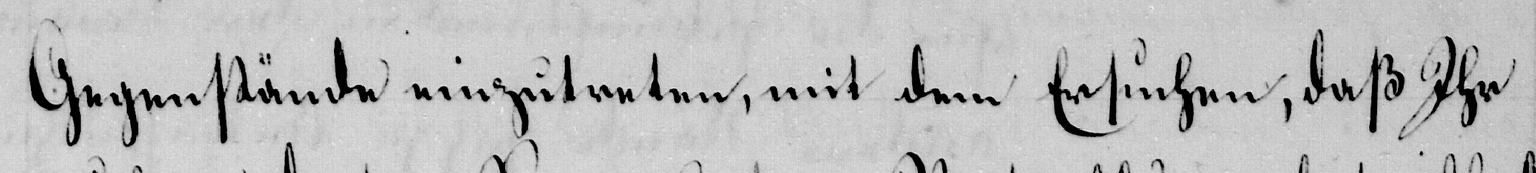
Gegenstände einzutreten, mit dem Ersuchen, daß ihr
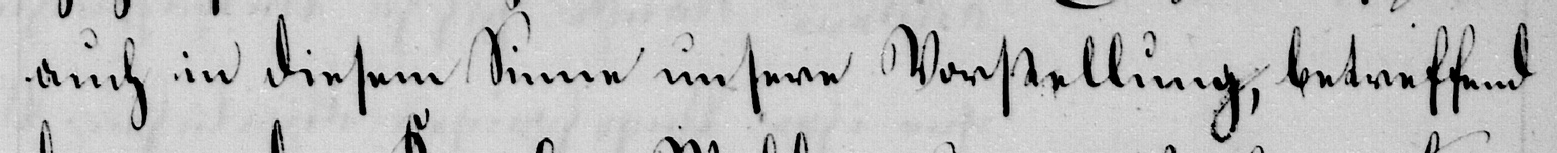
auch in diesem Sinne unsere Vorstellung, betreffend
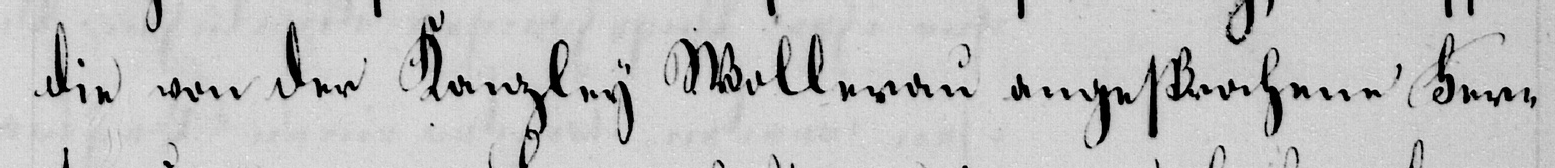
die von der Kanzley Wollerau ausgesprochene Fer¬
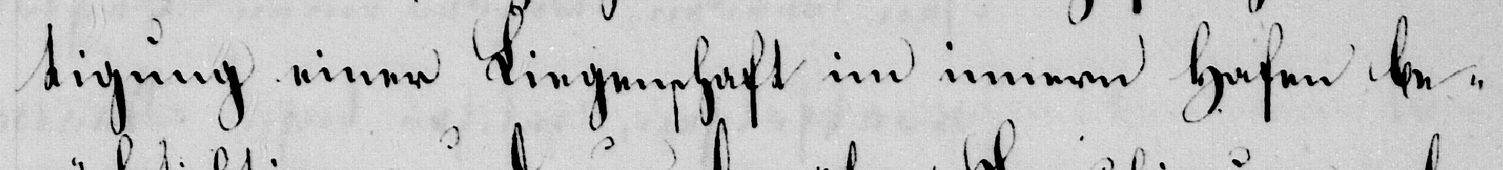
tigung einer Liegenschaft im innern Hafen be¬
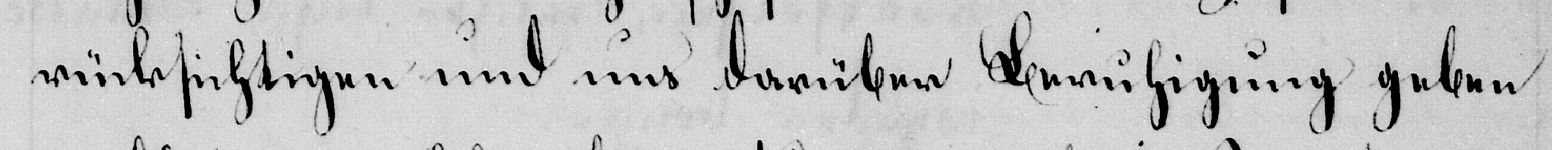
rücksichtigen und uns darüber Beruhigung geben
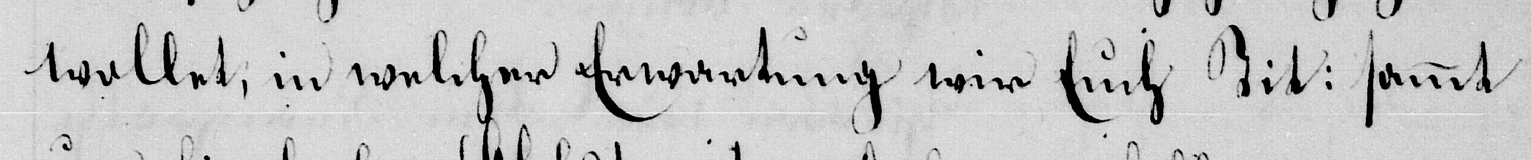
wollet, in welcher Erwartung wir Euch Tit: sammt
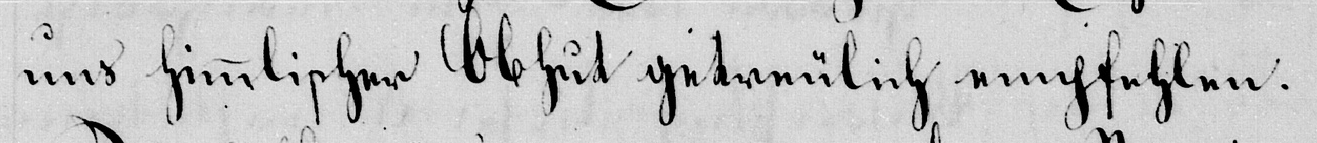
uns himmlischer Obhut getreulich empfehlen.
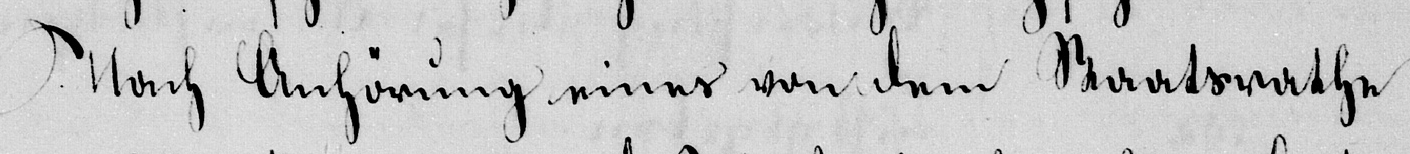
Nach Anhörung eines von dem Staatsrathe
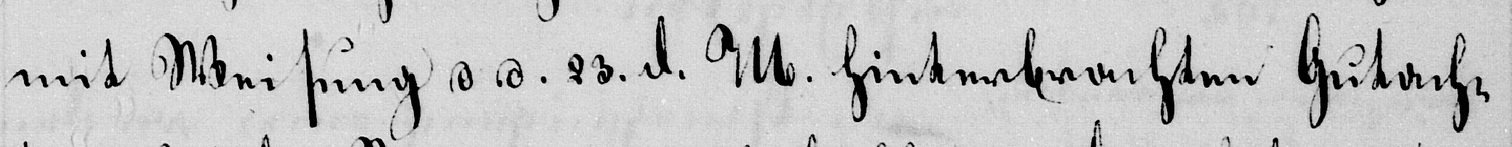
mit Weisung d. d. 23. d. M. hinterbrachten Gutach¬
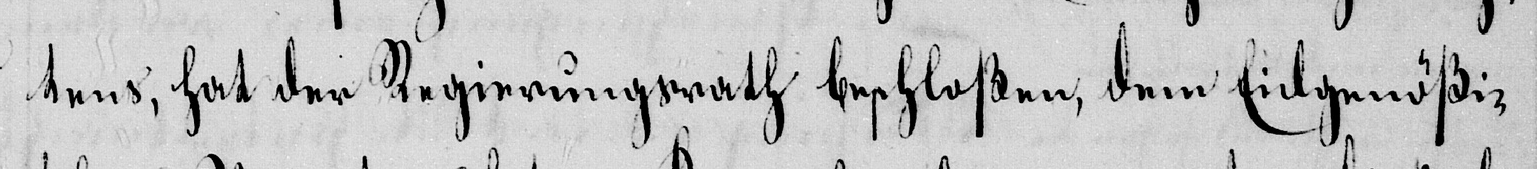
tens, hat der Regierungsrath beschloßen, dem Eidgenößi¬
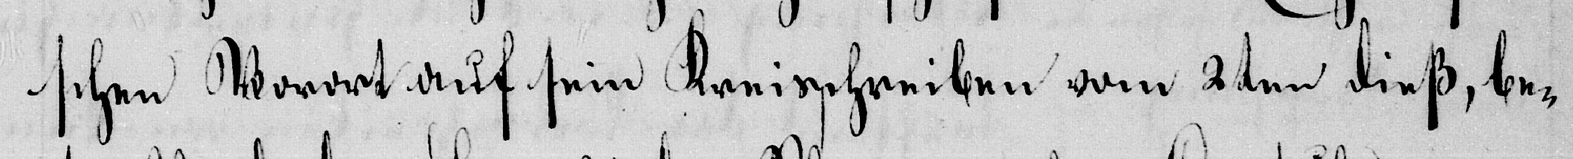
schen Vorort auf sein Kreisschreiben vom 2ten dieß, be¬
